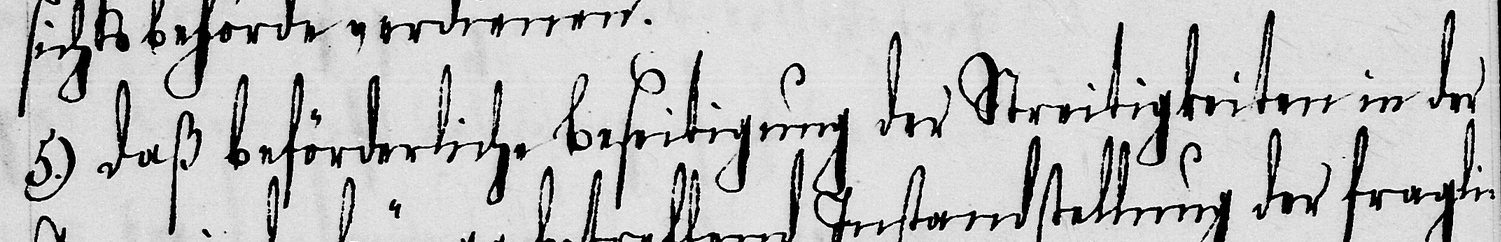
5.) daß beförderliche Beseitigung der Streitigkeiten in der
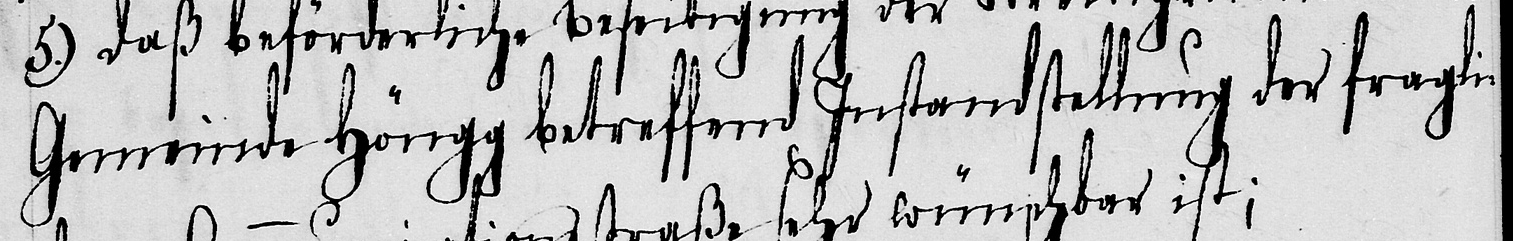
Gemeinde Höngg betreffend Instandstellung der frag¬
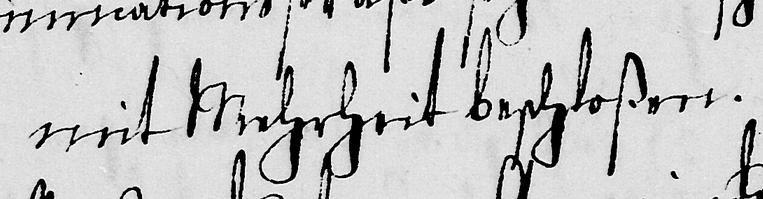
mit Mehrheit beschloßen.
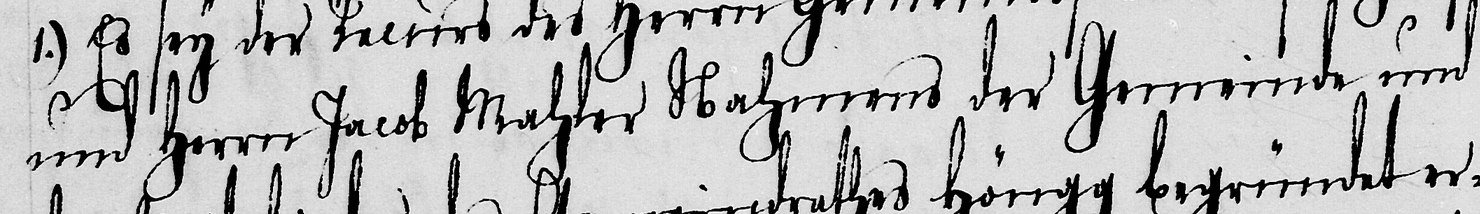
und Herrn Jacob Mahler Nahmens der Gemeinde und
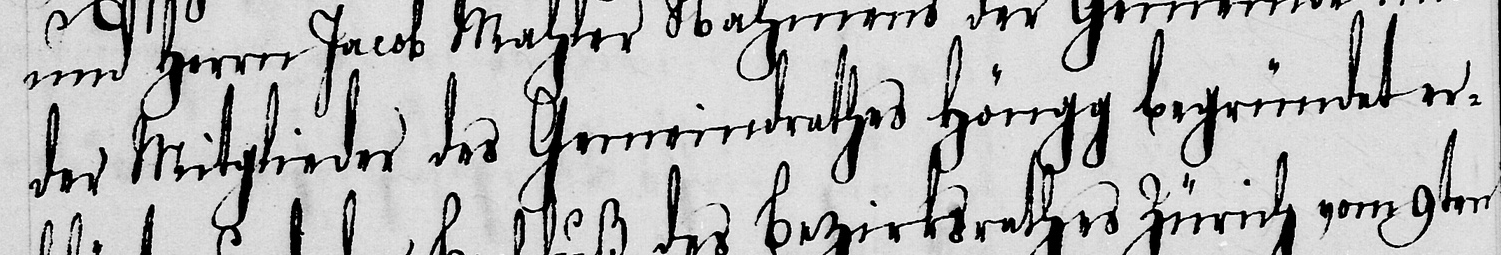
der Mitglieder des Gemeindrathes Hönng begründet er¬
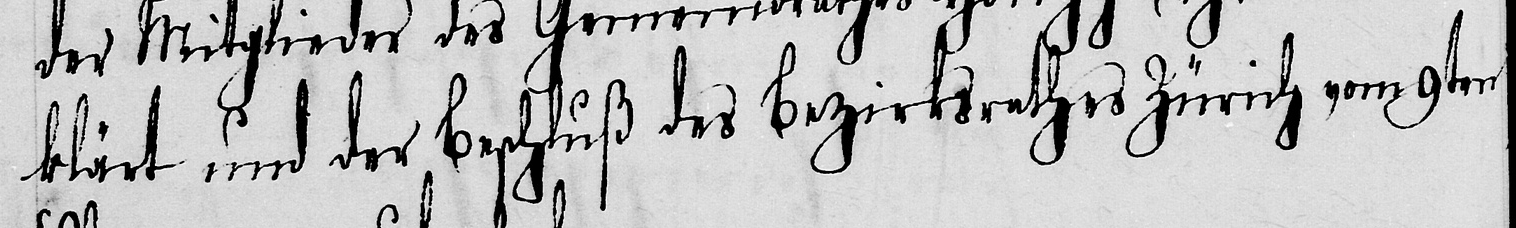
klärt und der Beschluß des Bezirksrathes Zürich vom 9ten
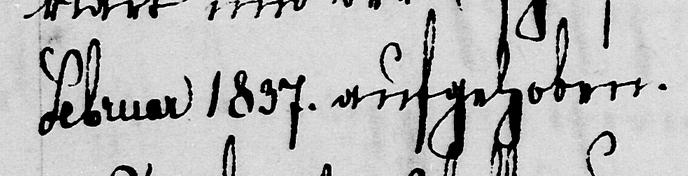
Februar 1837. aufgehoben.
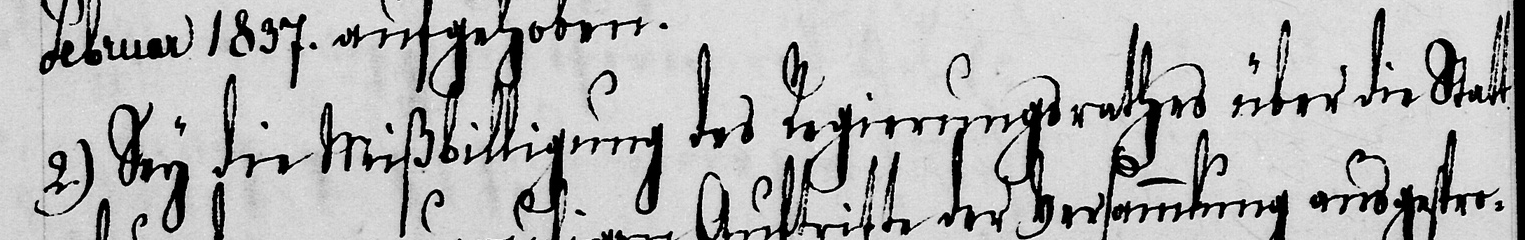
2.) Sey die Mißbilligung des Regierungsrathes über die Sta¬
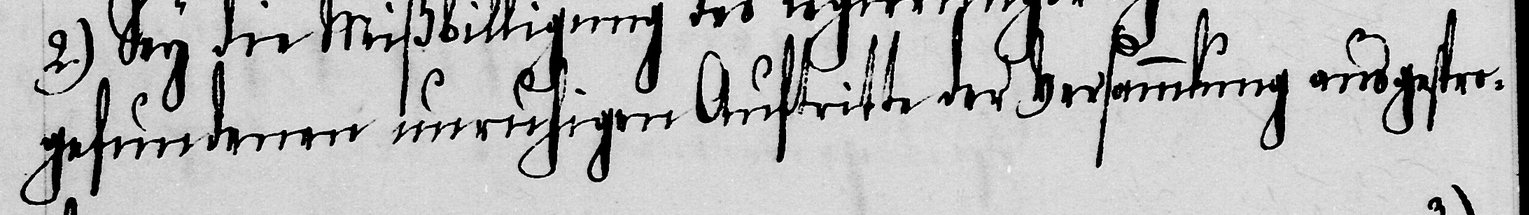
gefundenen unruhigen Auftritte der Versammlung ausgespro¬
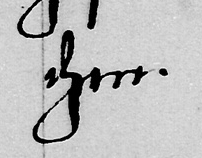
chen.
